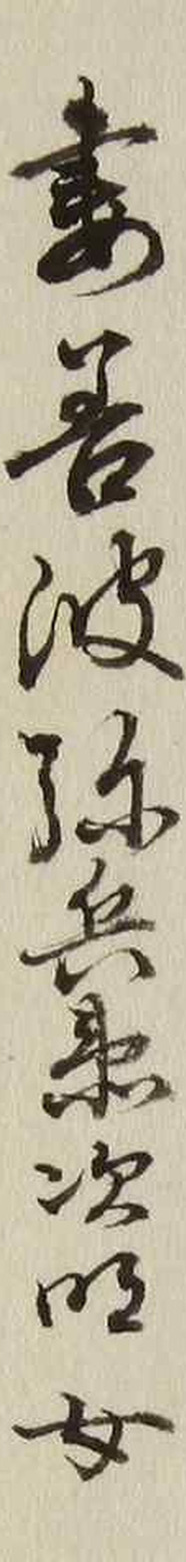妻善波弥兵衛次明女
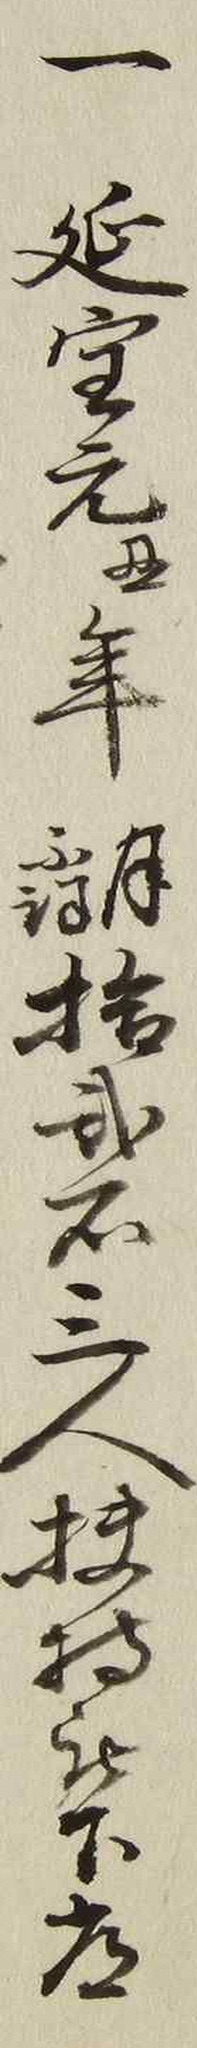一延宝元丑年月不詳拾弐石三人扶持下常
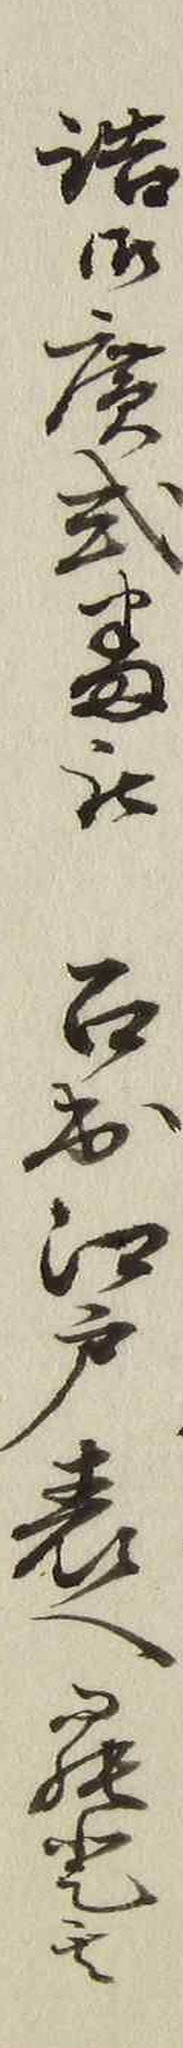詰御広式番被召出江戸表へ罷登其
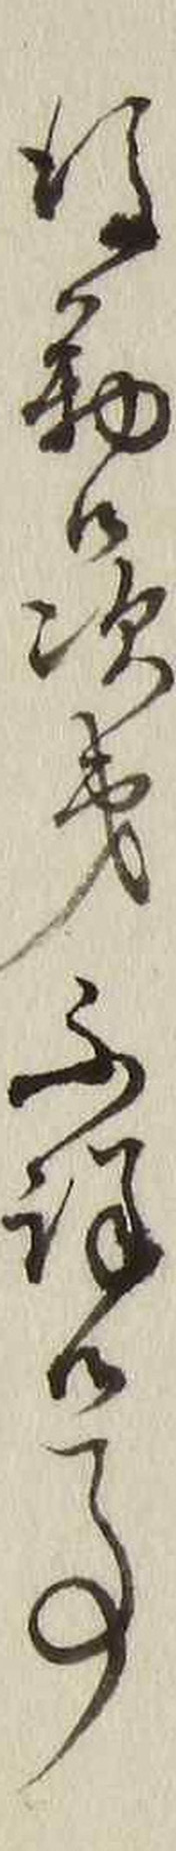後勤候次第不詳候事
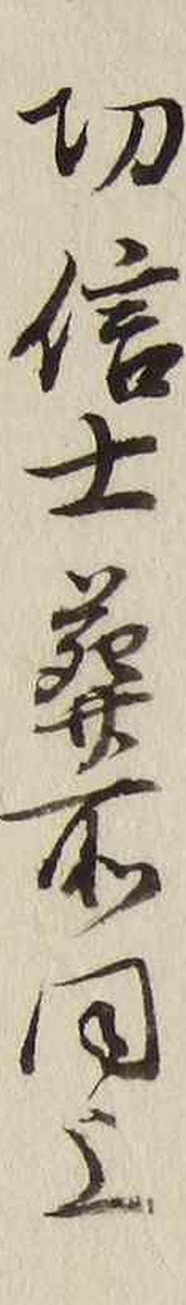切信士葬所同上

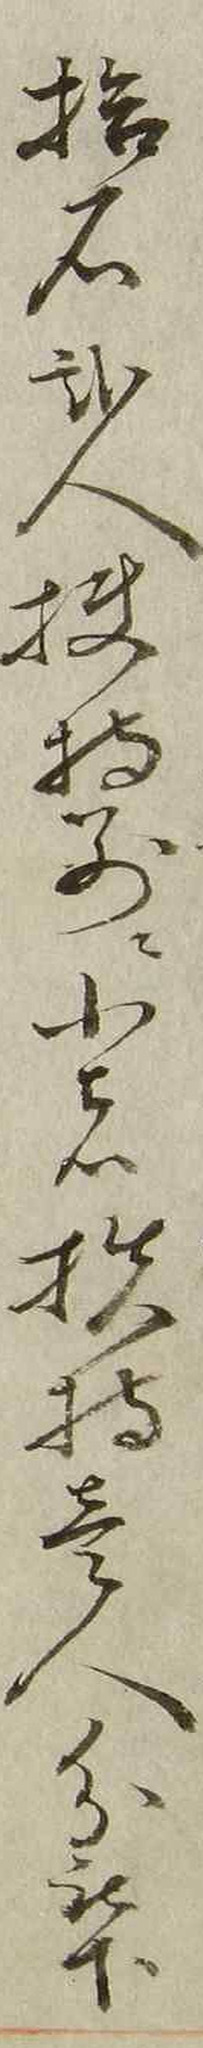拾石弐人扶持別ニ小者扶持壱人分被下
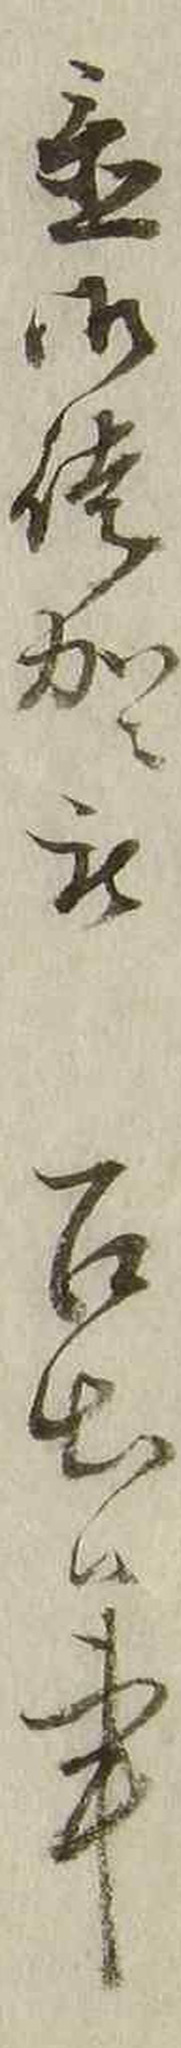置御徒加ニ被召出候事
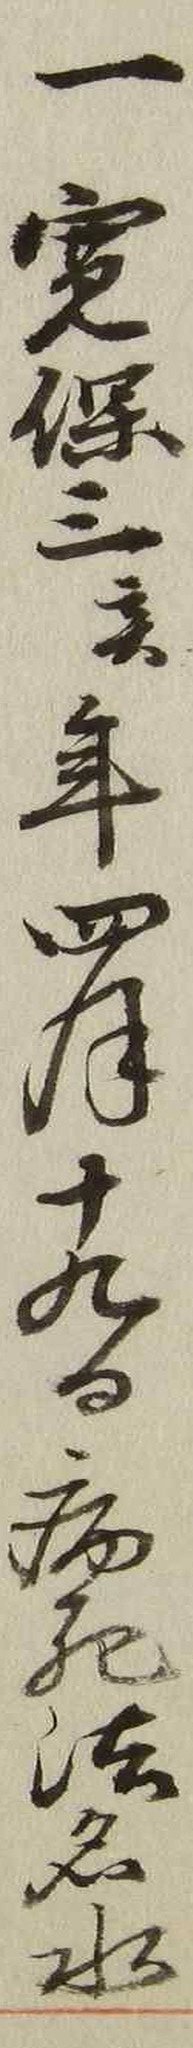一寛保三亥年四月十九日病死法名水
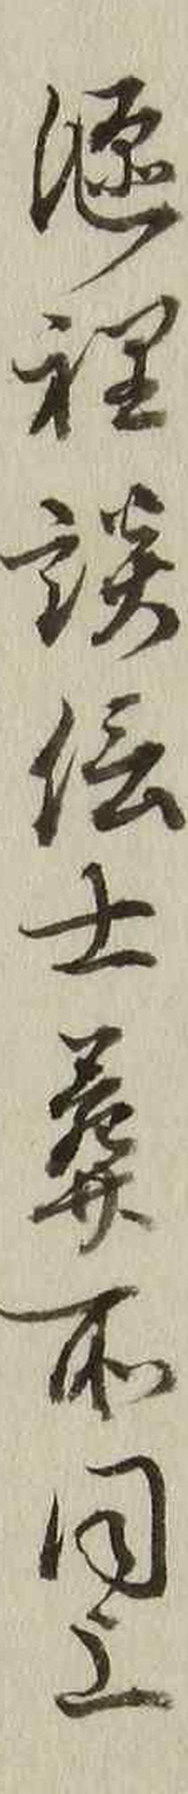漚程談信士葬所同上
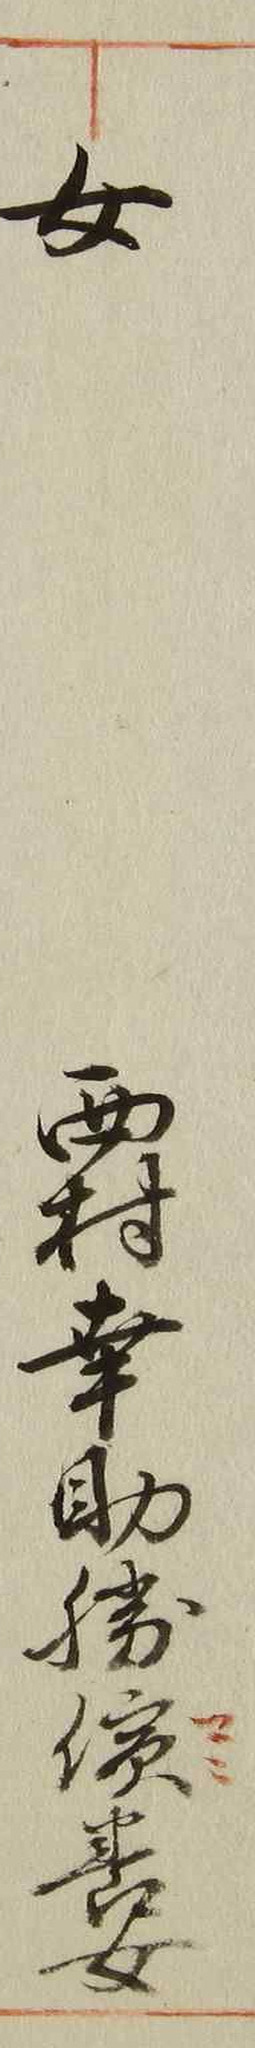女西村幸助勝濱養女
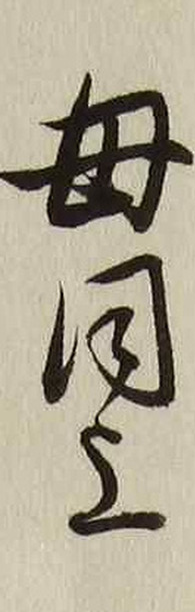母同上
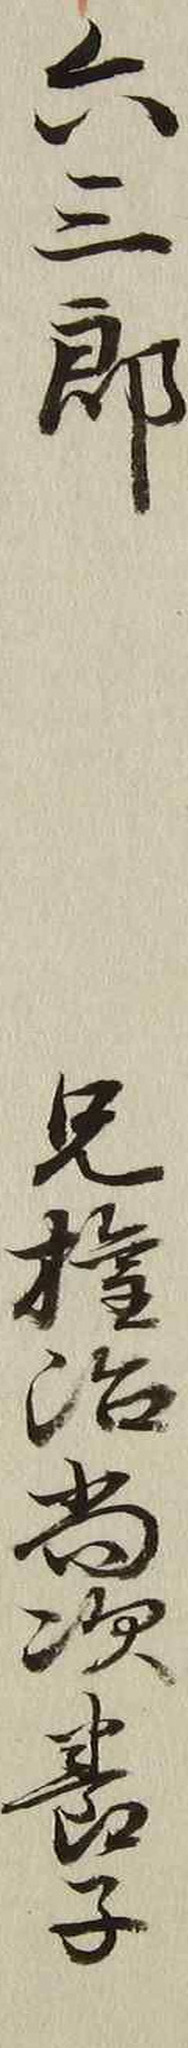六三郎兄権治尚次養子
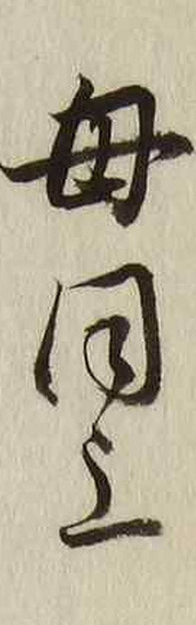母同上
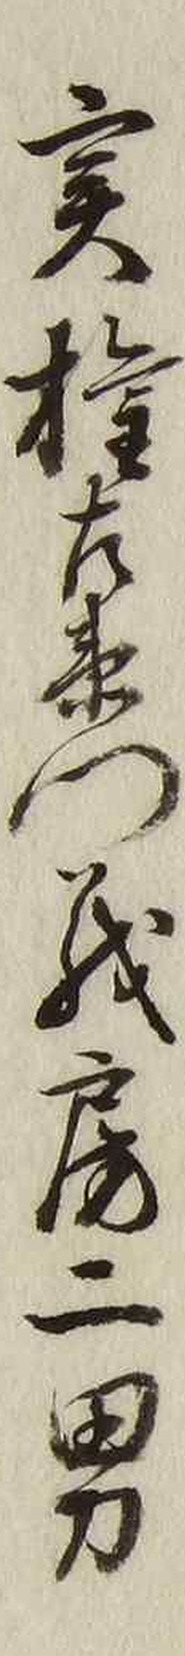実権左衛門義房二男

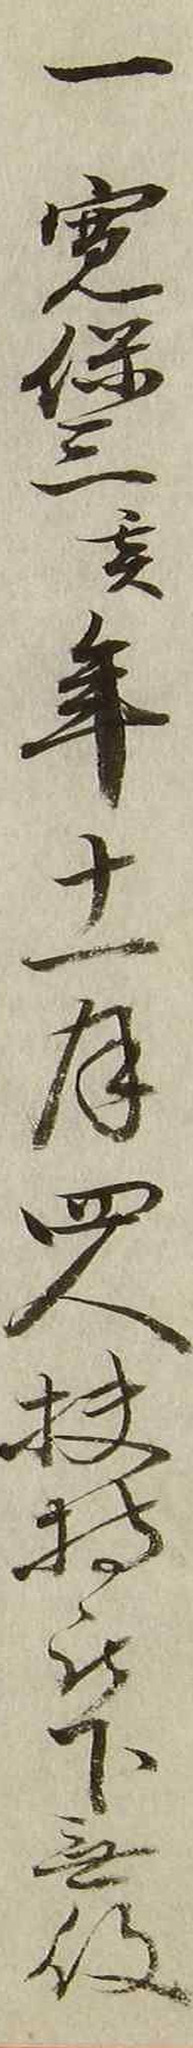一寛保三亥年十一月四人扶持被下無役
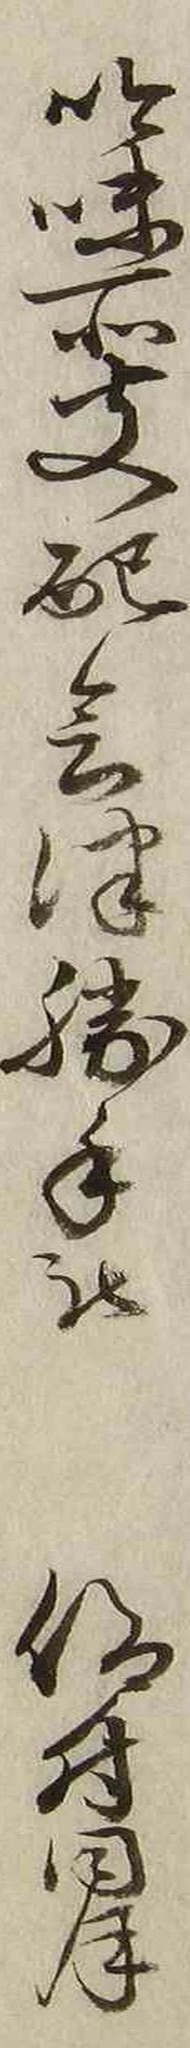吟味所支配会所勝手被仰付同月
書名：諸士系譜　巻之39　は之部7
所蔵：会津若松市立会津図書館
